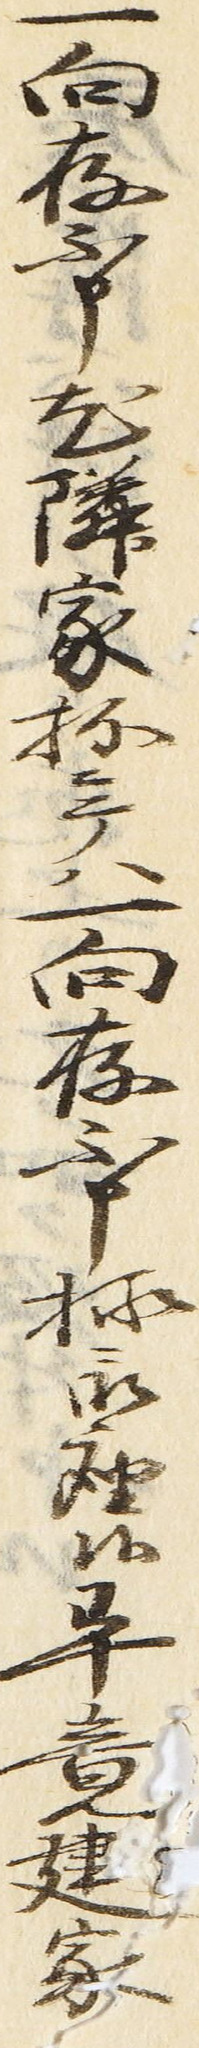一向存不申尤隣家抔にては一向存不申候に御座候畢竟建家
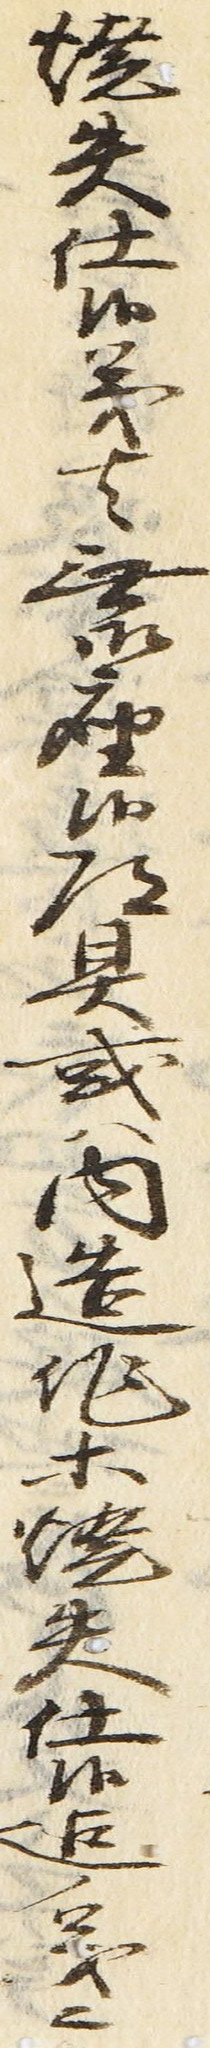焼失仕候義は無御座候道具或は内造作等焼失仕候迄の義に
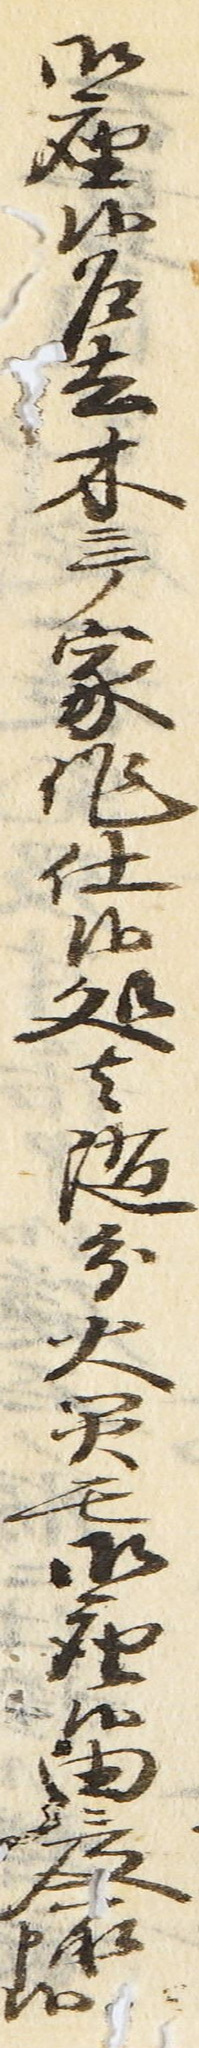御座候乍去木にて家作仕候処は随分火災も御座候由に及承申候
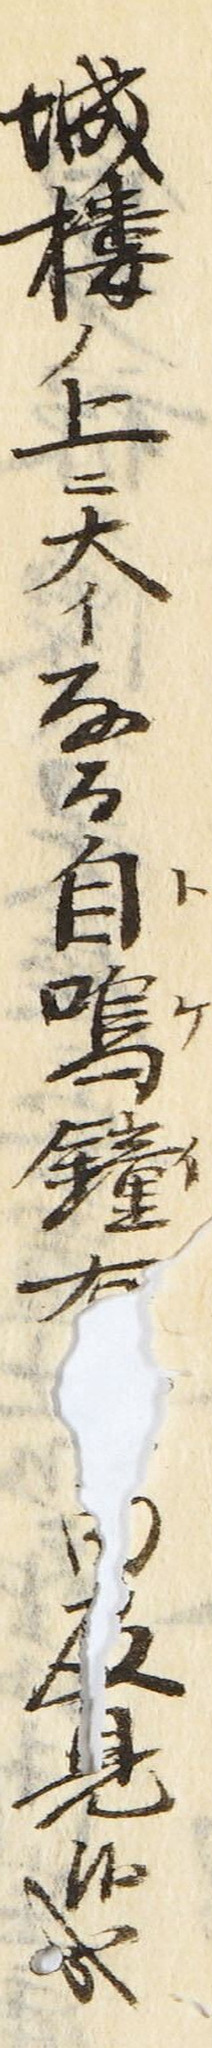城楼の上に大いなる自鳴鐘有由及見候哉
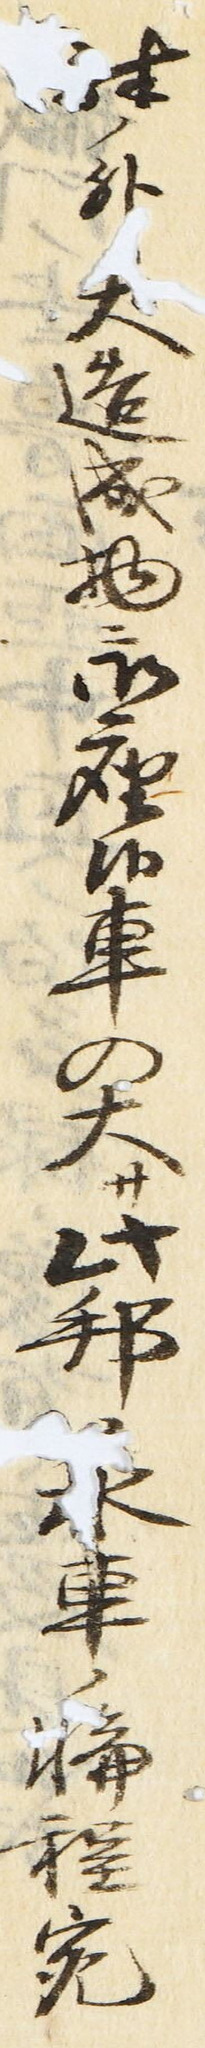殊の外大造成物に御座候車の大さ此邦の水車の輪程宛
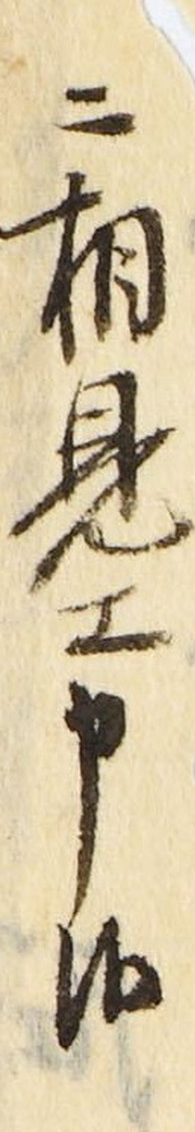に相見え申候

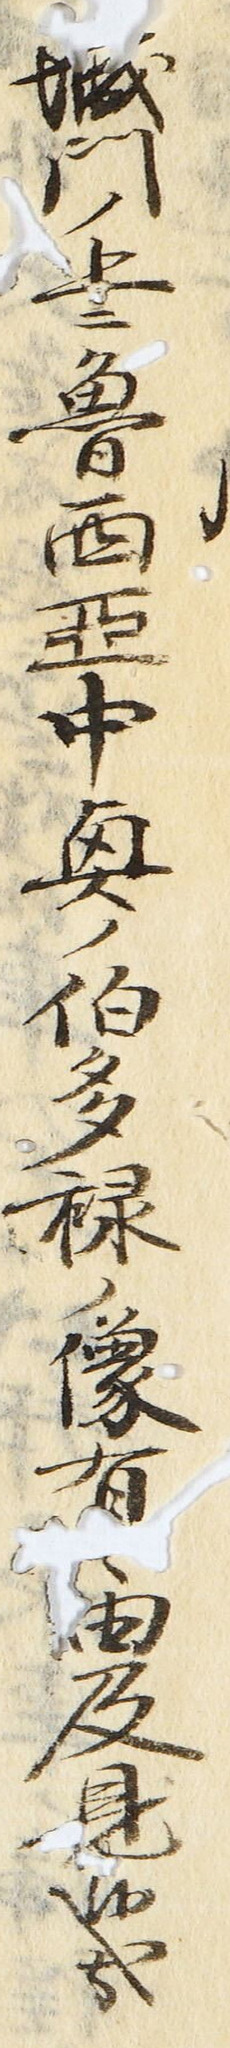城門の上に魯西亜中興の伯多禄の像有之由及見候哉
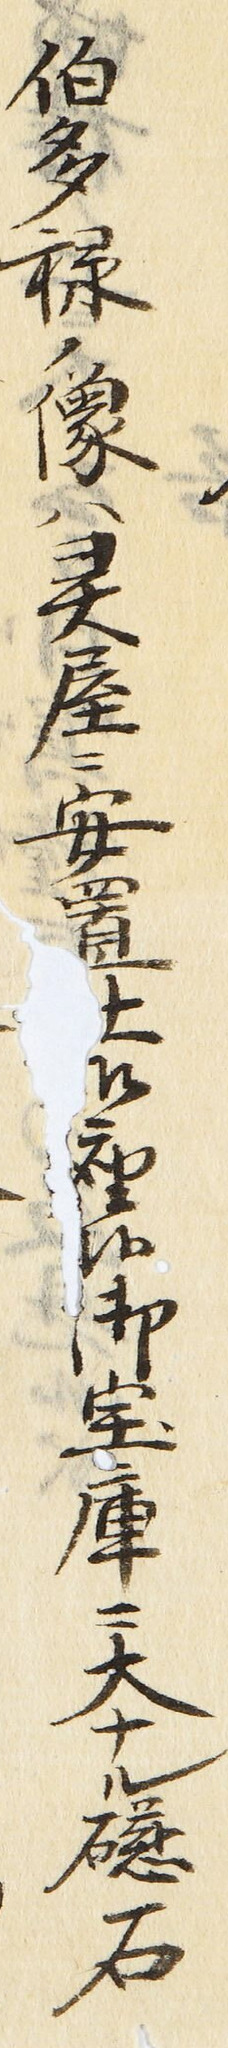伯多禄の像は霊屋に安置仕御座候御宝庫に大なる磁石
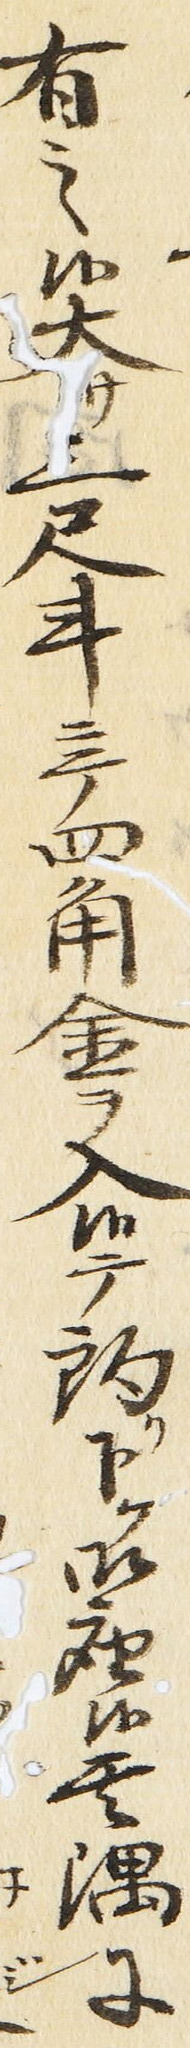有之候大さ三尺斗にて四角金を入候て釣り下け御座候其隅に
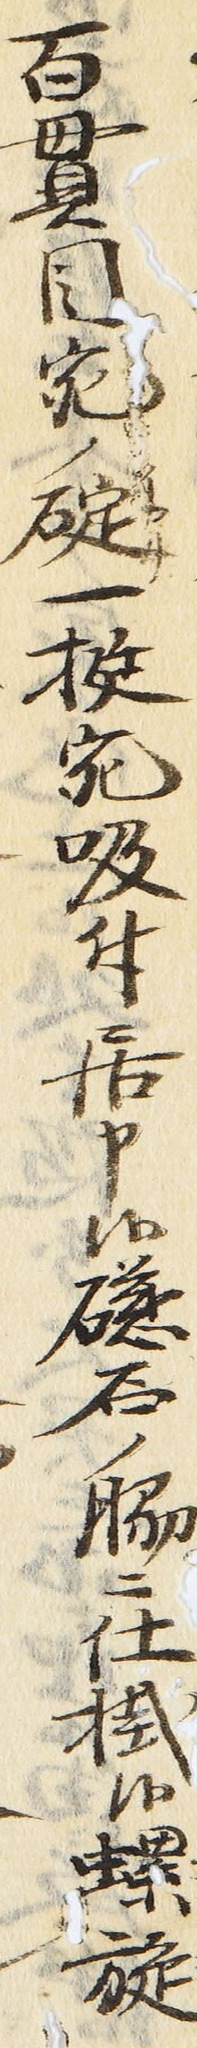百貫目宛の碇一挺宛吸付居申候磁石の脇に仕掛候螺旋
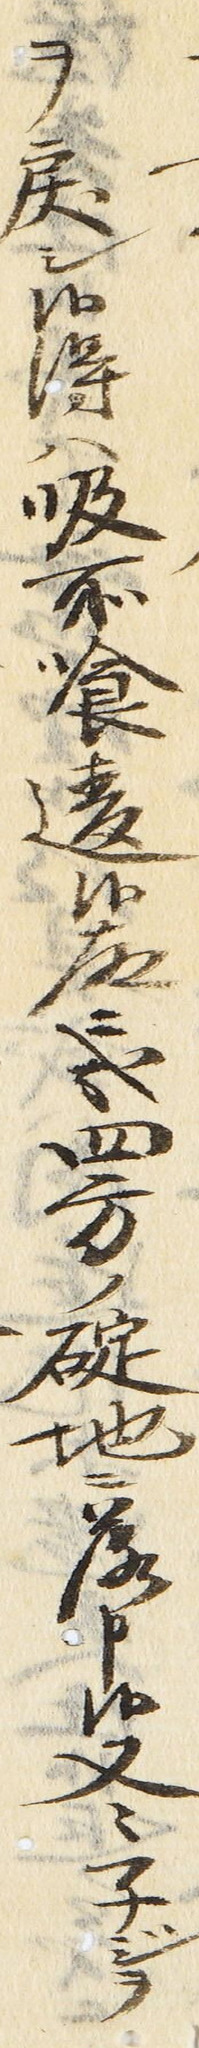を戻し候得は吸所喰違候故に哉四方の碇地に落申候又々ねじを
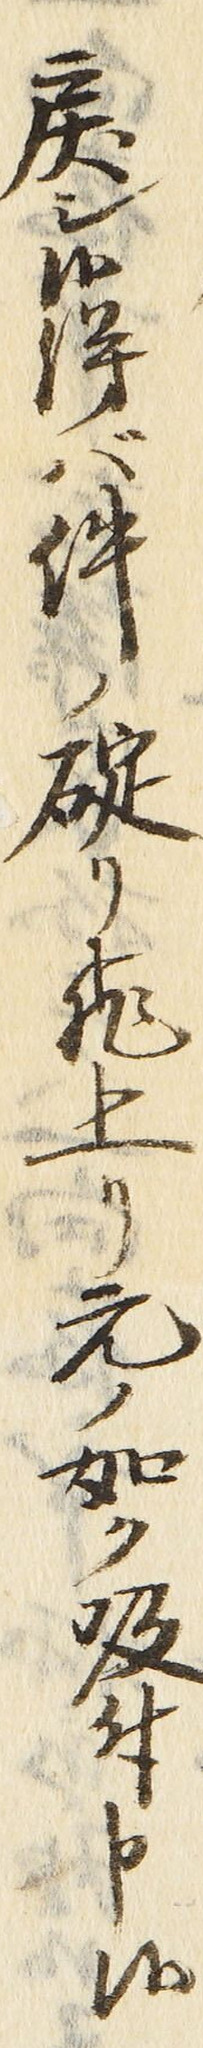戻し候得ば件の碇り飛上り元の如く吸付申候
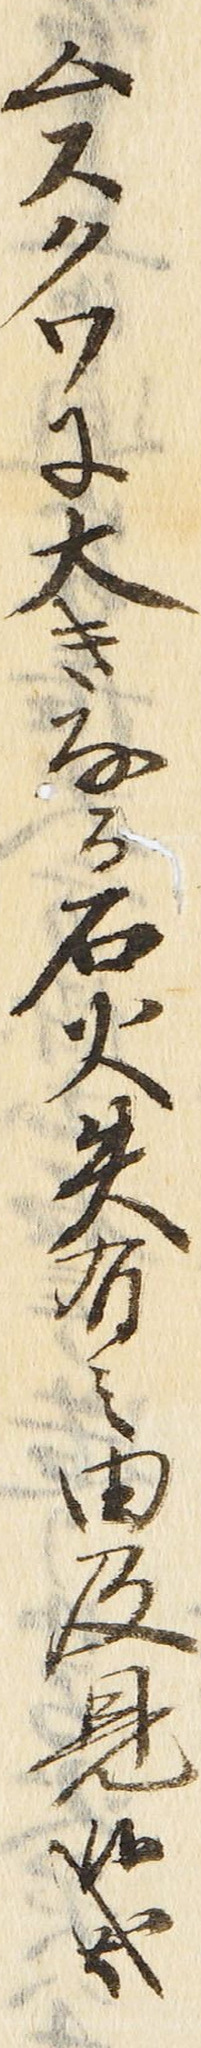ムスクワに大きなる石火矢有之由及見候哉
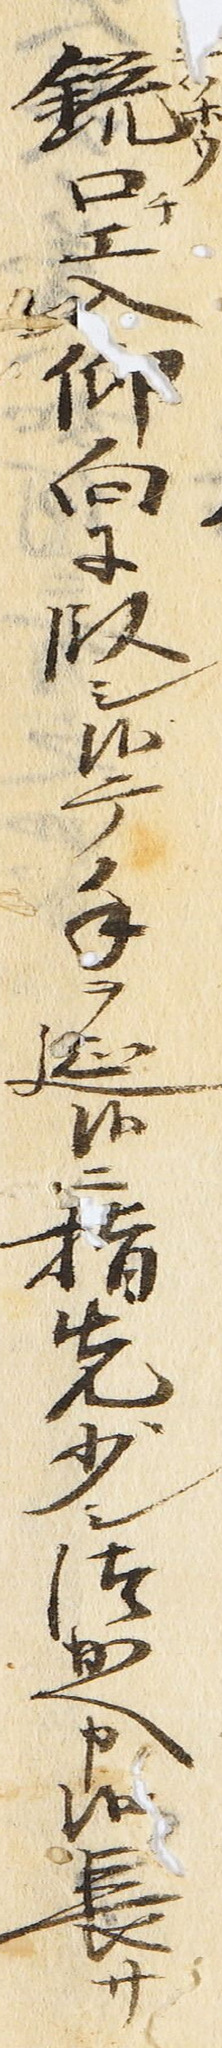銃口ちえ入仰向に収し候て手を延候に指先少しつかへ申候長さ
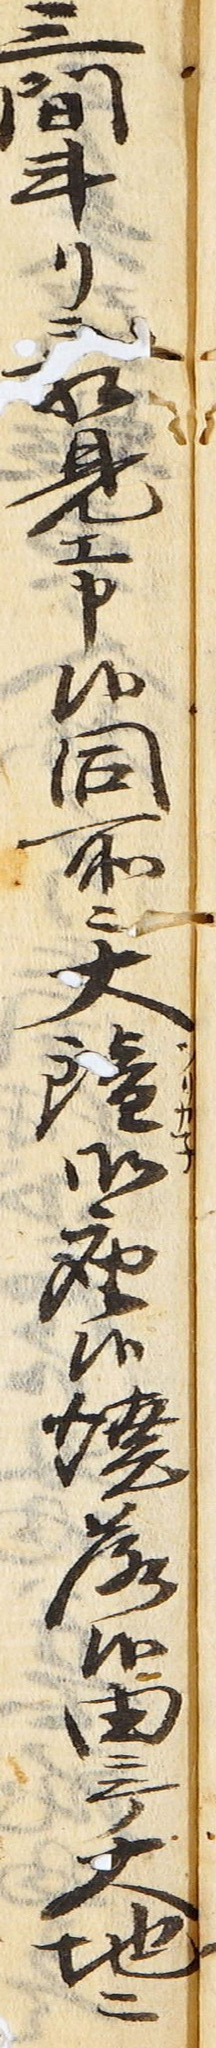三間斗りに相見え申候同所に大鐘御座候焼落候由にて大地に
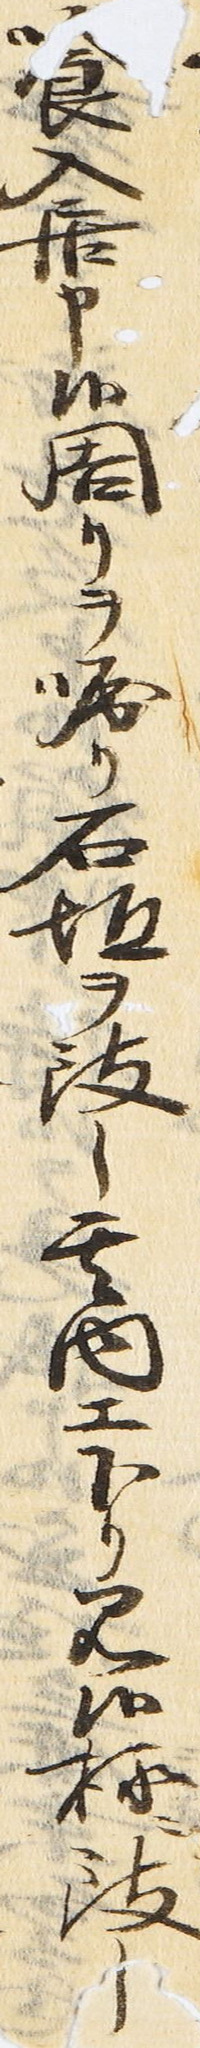喰入居申候周りを掘り石垣を致し其内え下り見候様に致し
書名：神昌丸漂流問答
